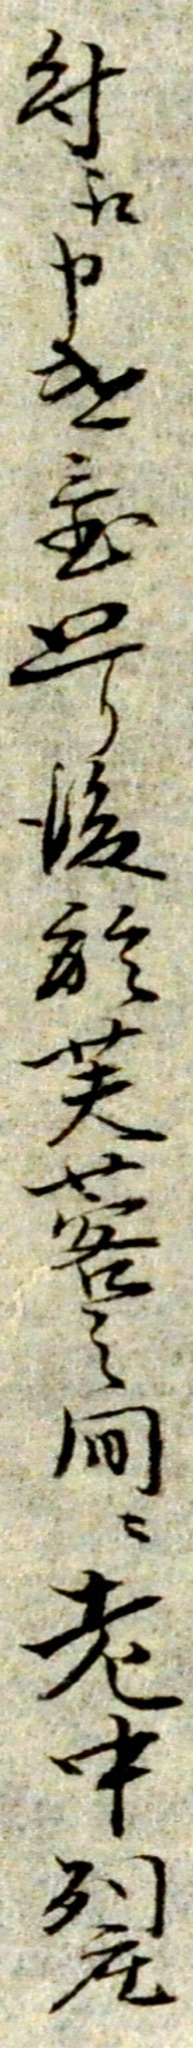付え申遣置廻り後於芙蓉之間ニ老中列座
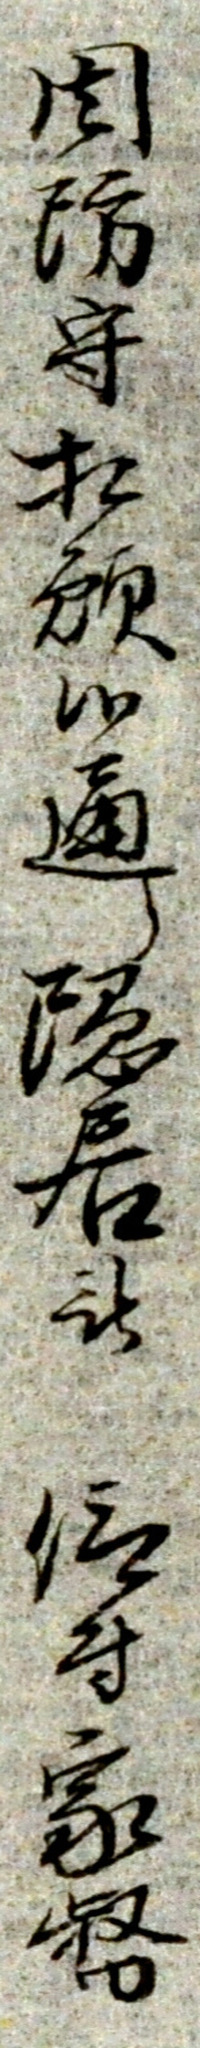周防守相願候通り隠居被仰付家督
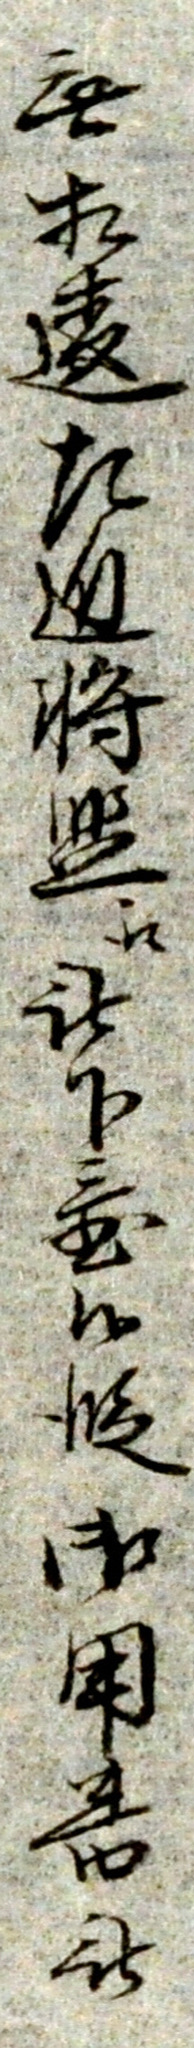無相違左近将監え被下置候段御用番被

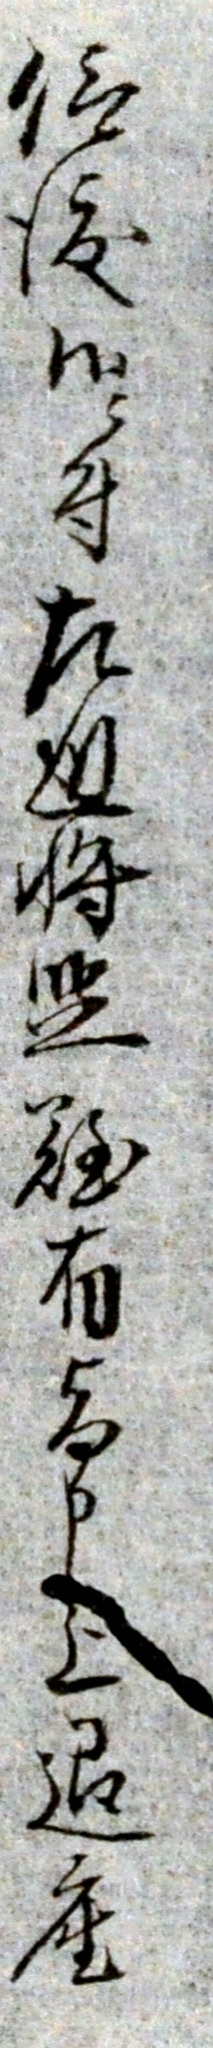仰渡候ニ付左近将監難有旨申上退座
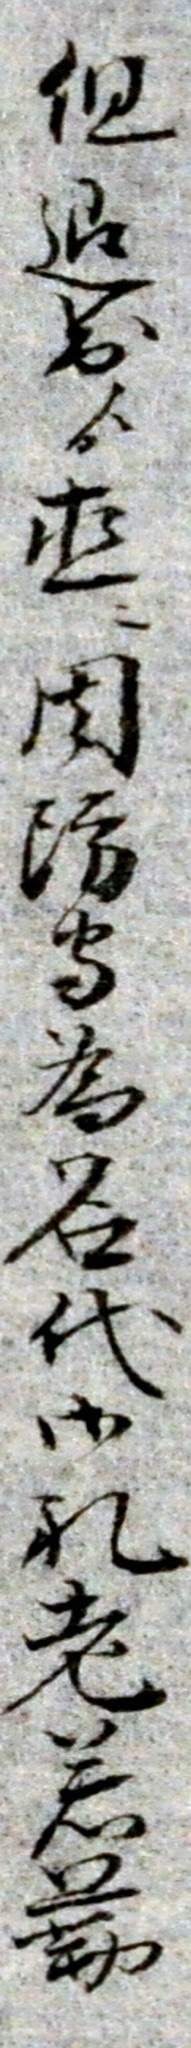但退出ゟ直ニ周防守為名代御礼老若廻勤
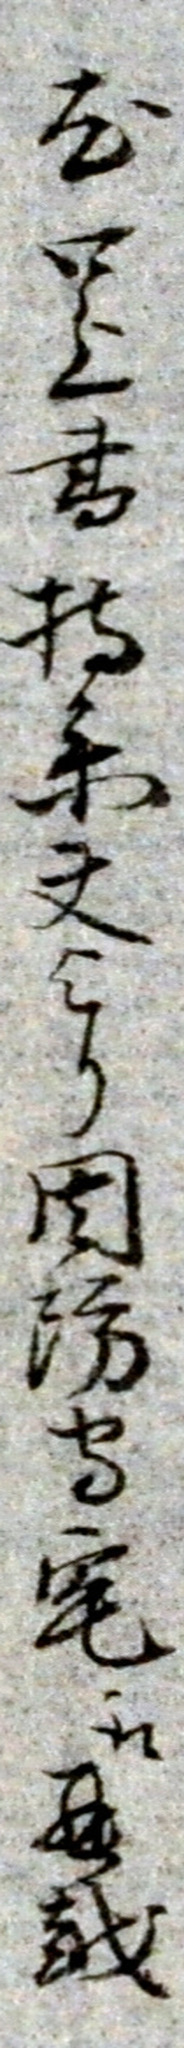尤口上書持参夫より周防守宅え罷越
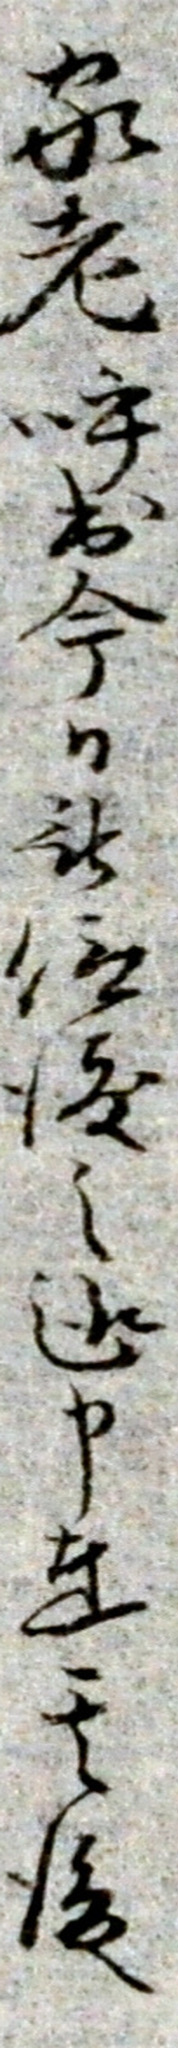家老呼出今日被仰渡之趣申述其後
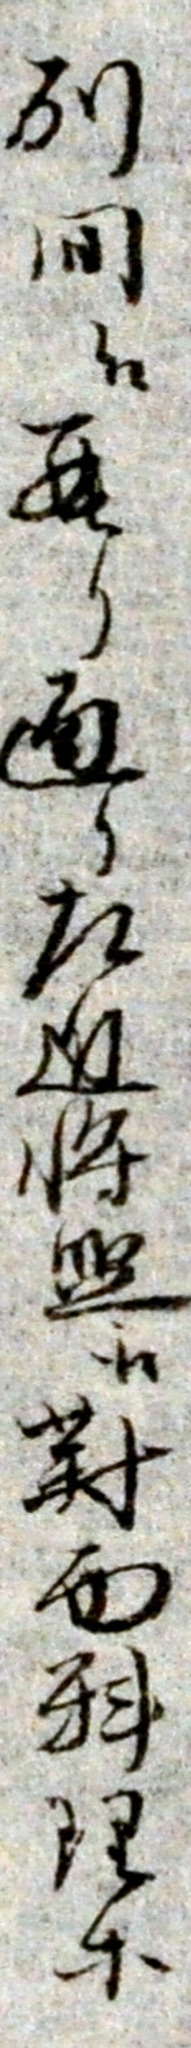別間え罷り通り左近将監え対面料理等
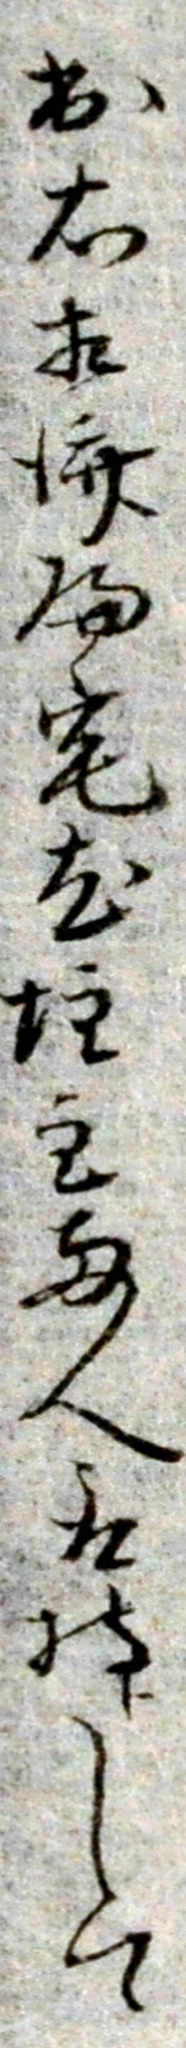出右相済帰宅尤坊主両人取持して
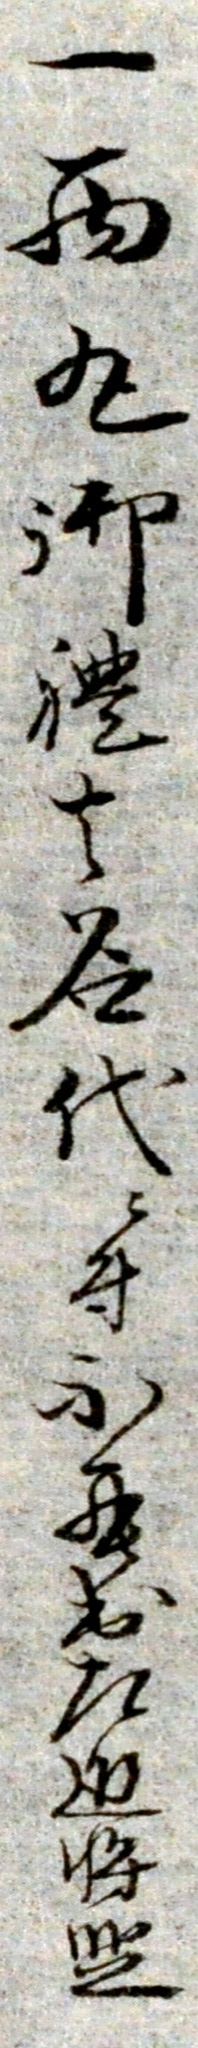一西丸御礼者名代ニ付不罷出左近将監
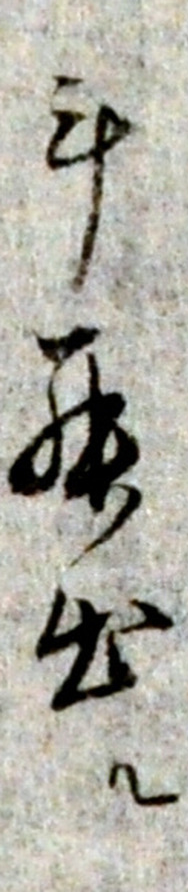計罷出ル
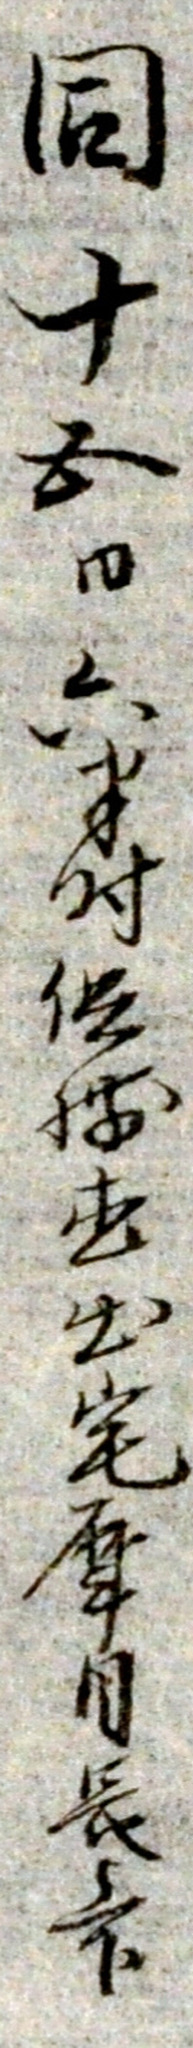同十五日六半時供揃直出宅熨目長上下
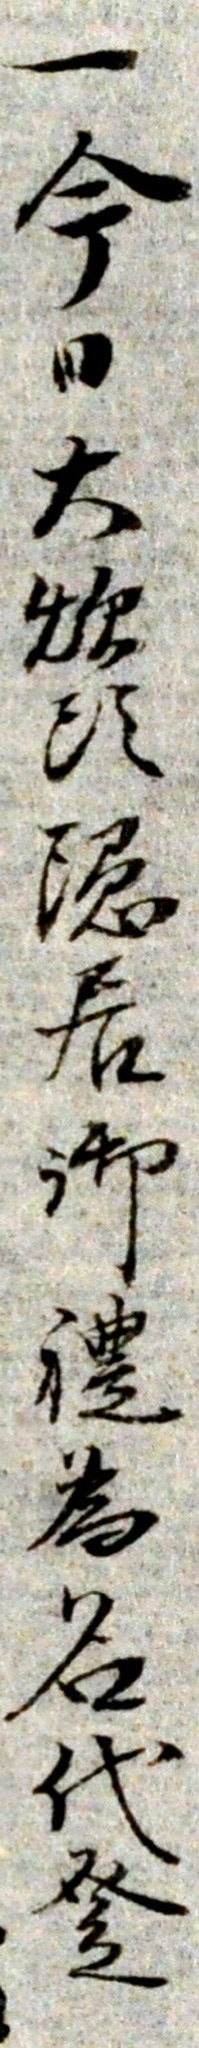一今日大炊頭隠居御礼為名代登
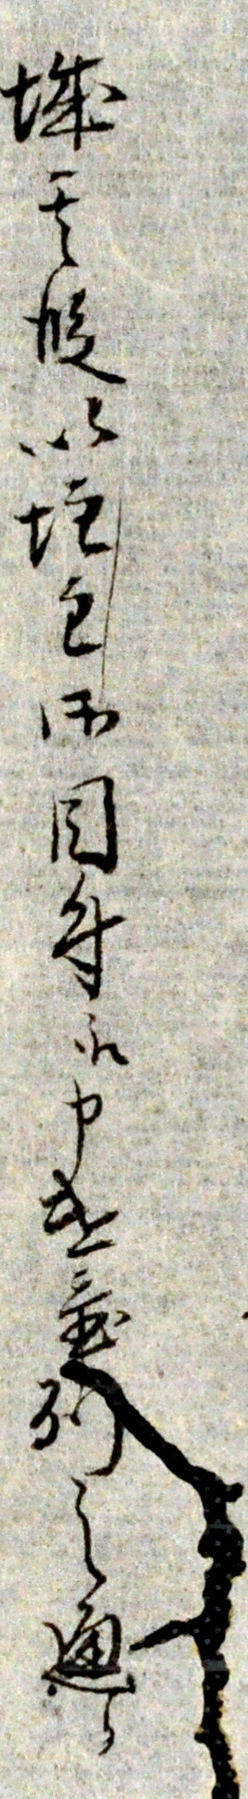城其段以坊主御目付え申遣置例之通り
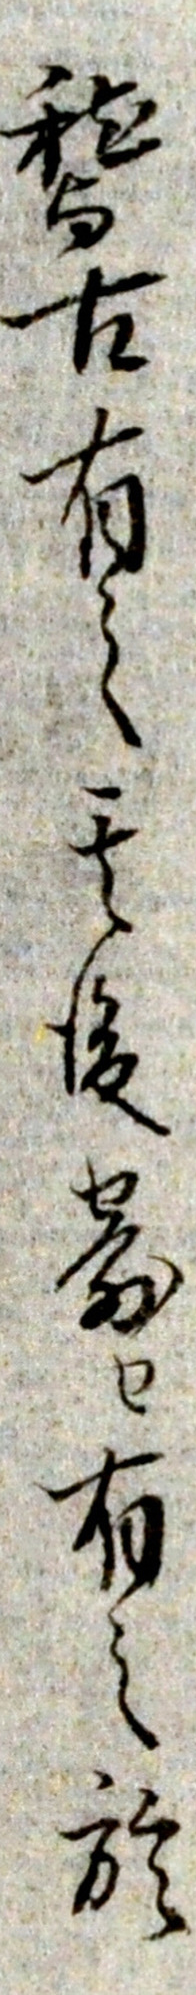稽古有之其後寄セ有之於
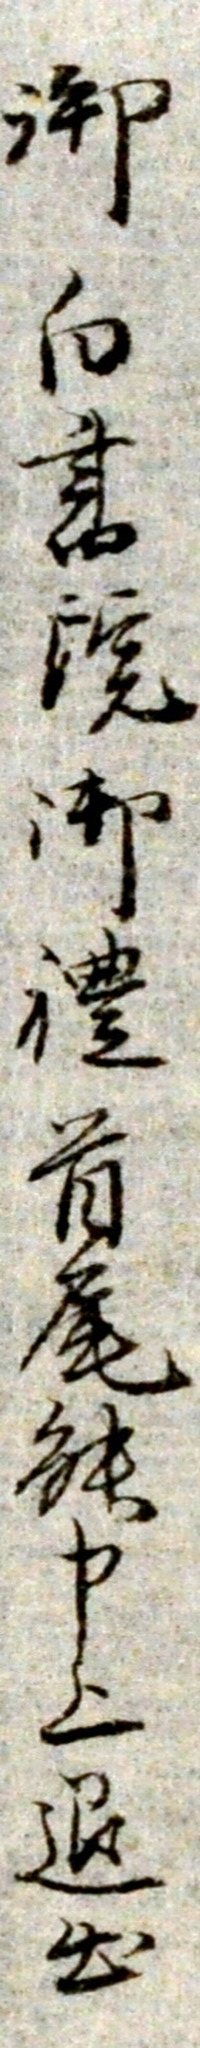御白書院御礼首尾能申上退出
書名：諸名代相勤候節ノ留書外
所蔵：伊那市立高遠町図書館・合同会社AMANE
